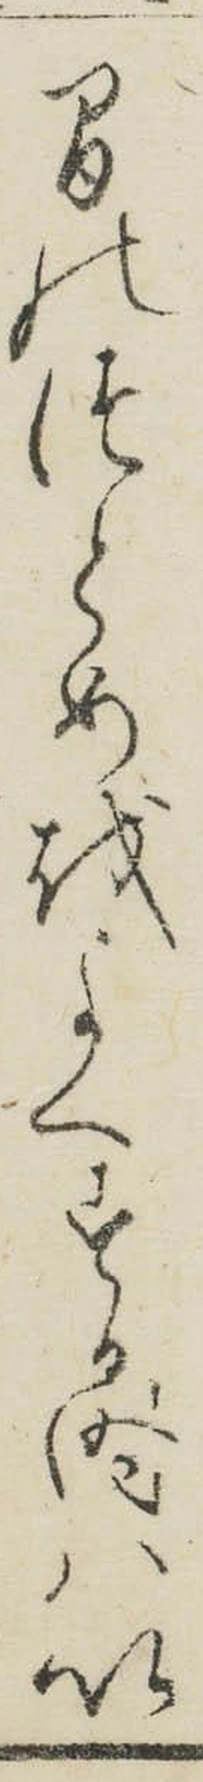間のつとめをよくする時はい
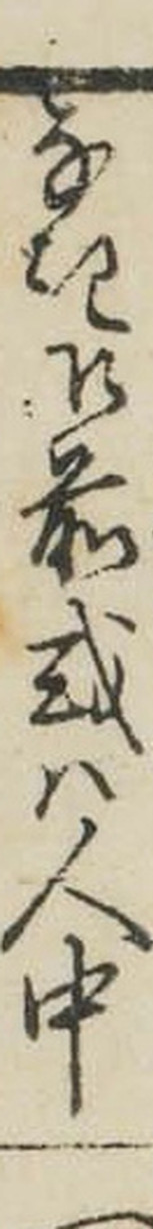なき御前或は人中
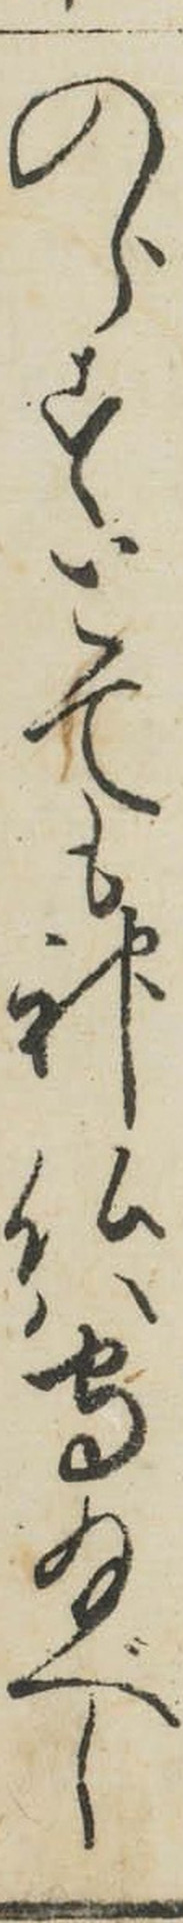のらすとても神仏は守給べし

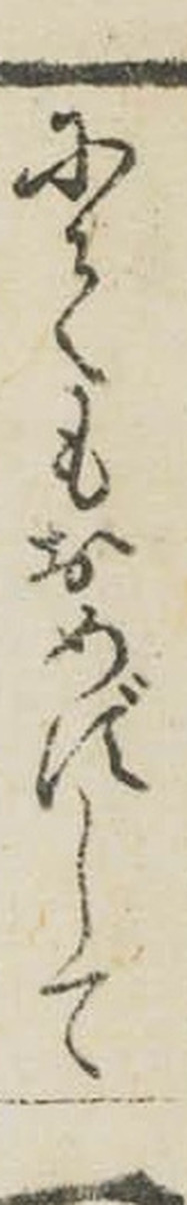にてもおめずして
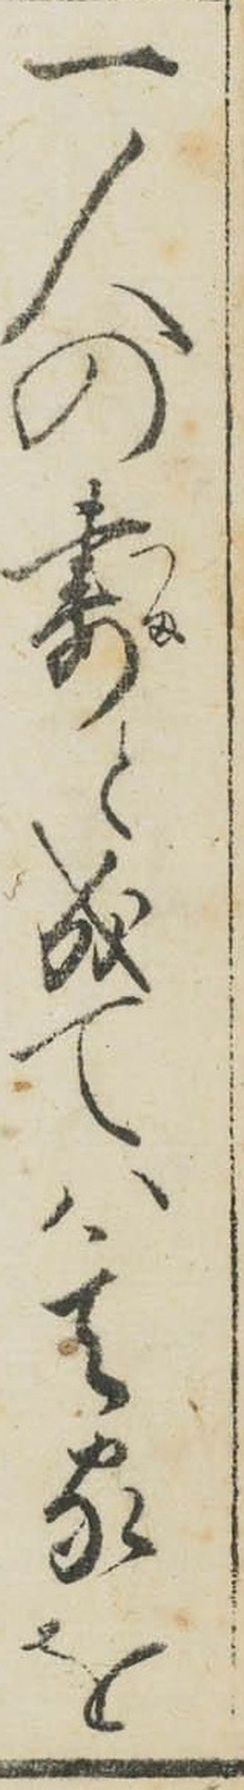一人の妻と成ては其家を
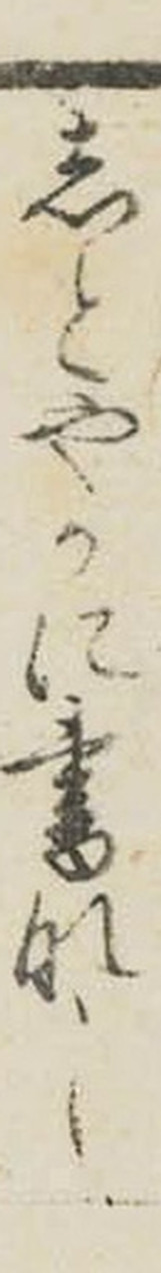しとやかに書なし
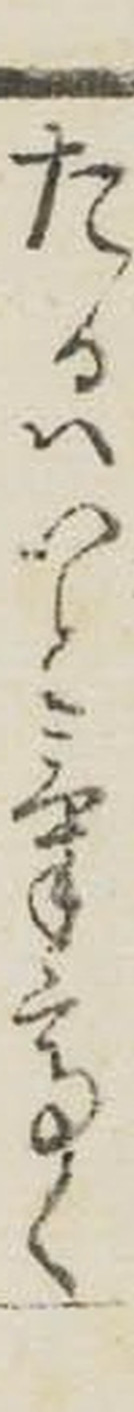たるはいと気高く
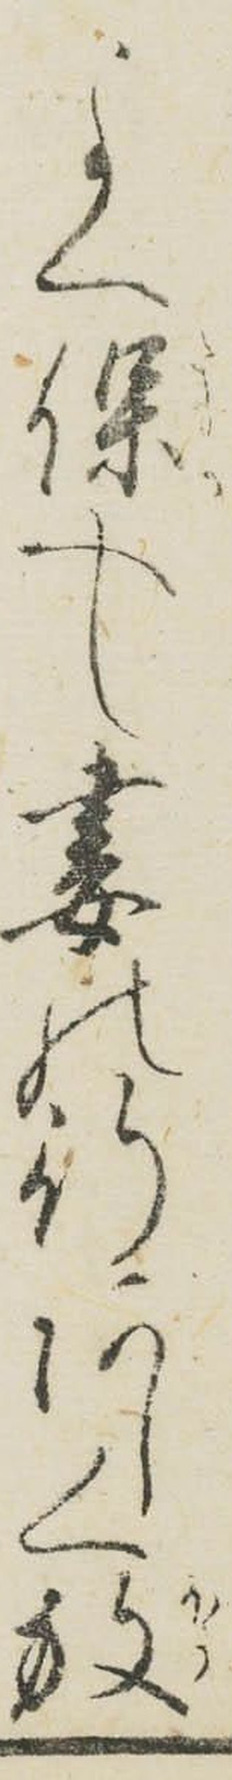よく保へし妻の行あしく放
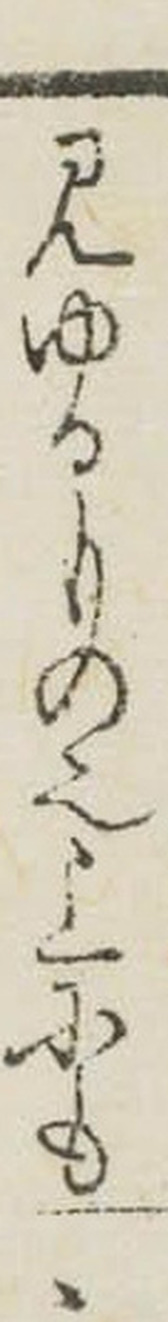見ゆるもの也上にも
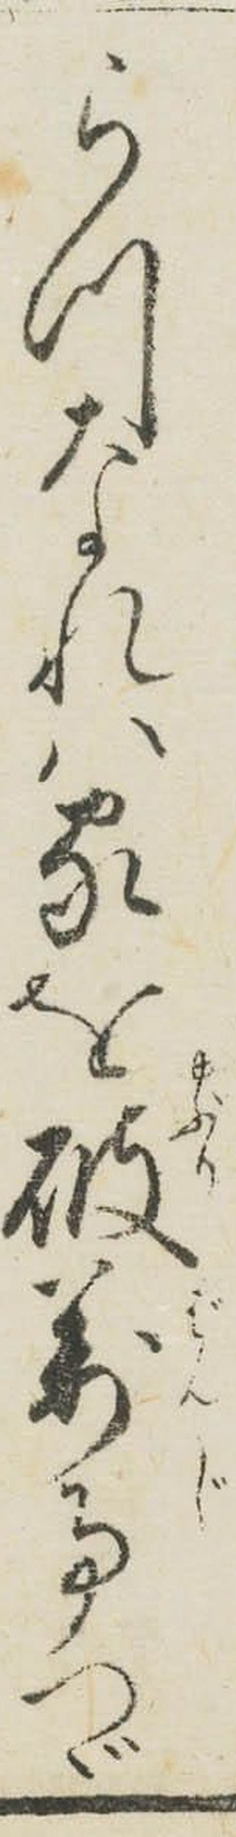らつなれは家を破万事つゞ
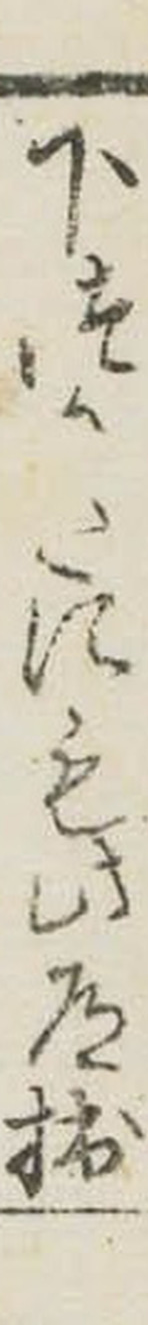下つかたにも此道拙
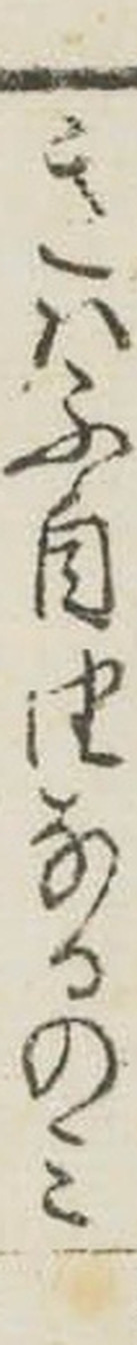きは不自由なるのみ
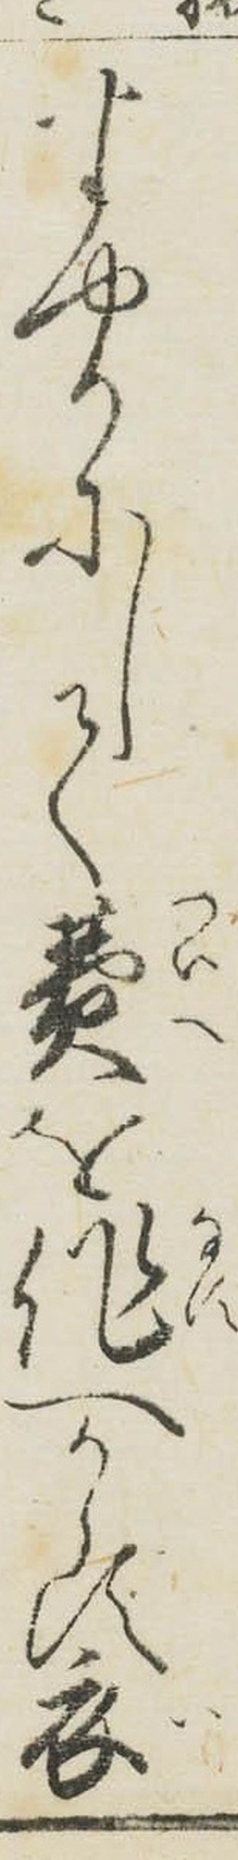まやかにして費を作へからず衣
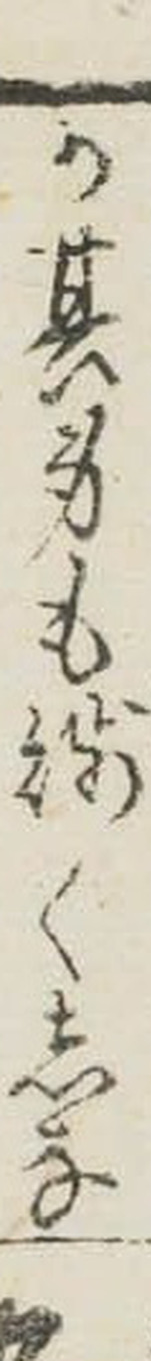か其身も賤くしな
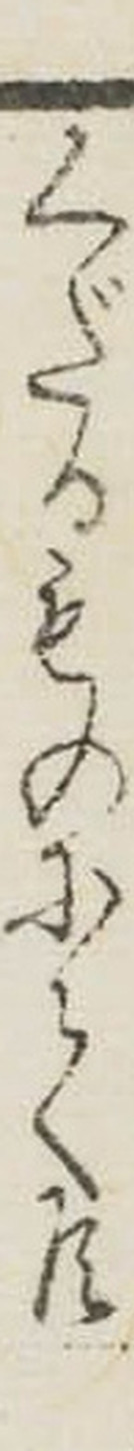くだるものにて凡
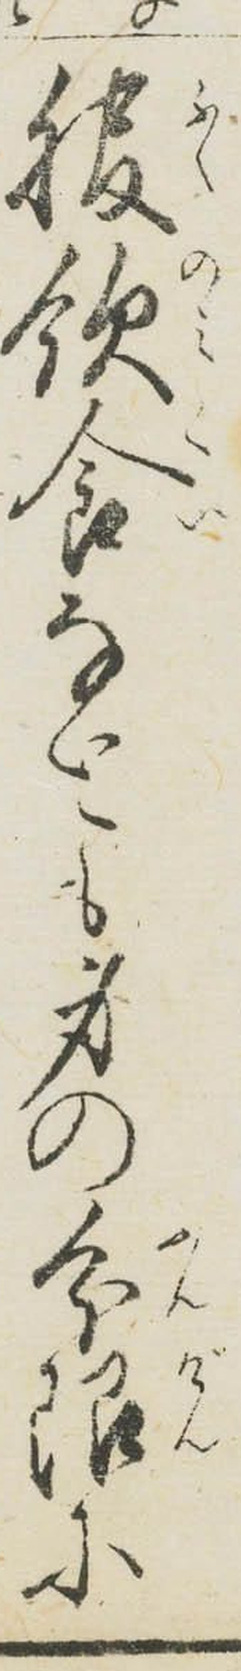服飲食なとも身の分限に
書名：女大学
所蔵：東京学芸大学教育コンテンツアーカイブ
